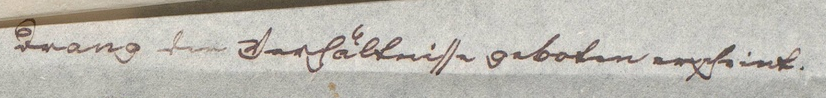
Drang der Verhältnisse geboten erscheint.
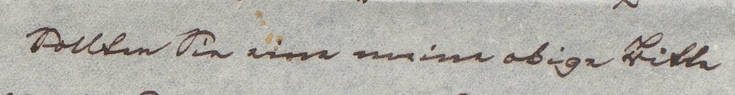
Sollten Sie eine meine obige Bitte
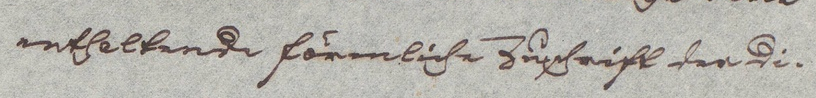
enthaltende förmliche Zuschrift der Di-
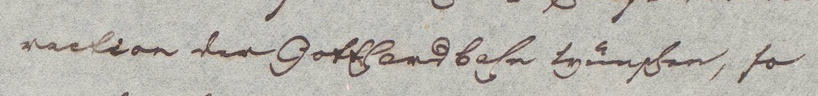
rection der Gotthardbahn wünschen, so
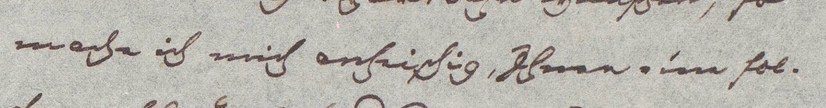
mache ich mich anheischig, Ihnen eine sol-
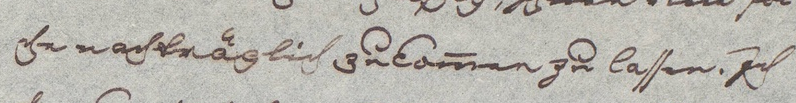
che nachträglich zukommen zu lassen. Ich
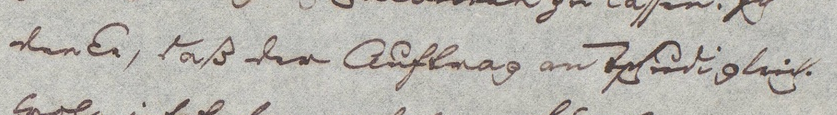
denke, daß der Auftrag an Tschudi gleich-
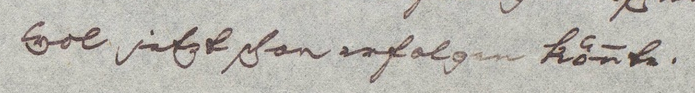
wol jetzt schon erfolgen könnte.
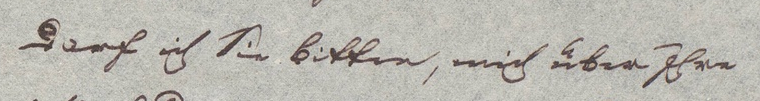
Darf ich Sie bitten, mich über Ihre
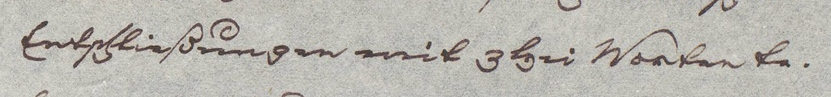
Entschließungen mit zwei Worten te-
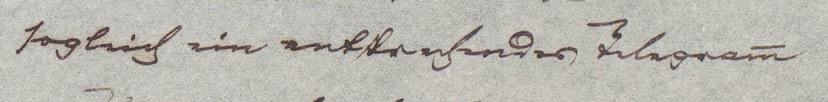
sogleich ein entsprechendes Telegramm
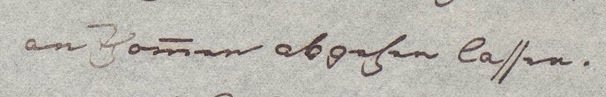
an Thommen abgehen lassen.
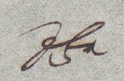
Escher
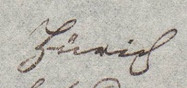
Zürich
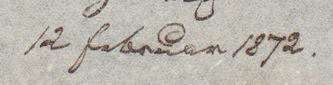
12 Februar 1872.
